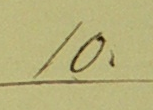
10
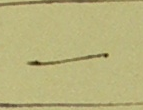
--
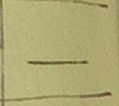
--
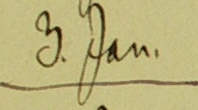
3. Jan.
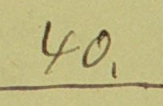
40.
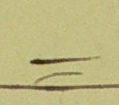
--
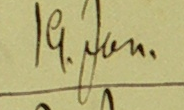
19. Jan
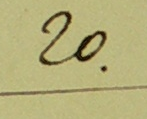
20
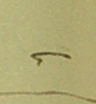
--
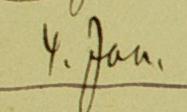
4. Jan
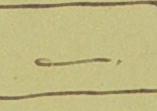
--
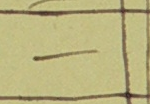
--
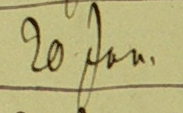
20. Jan
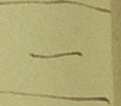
--
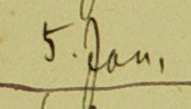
5. Jan.
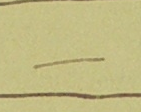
--
